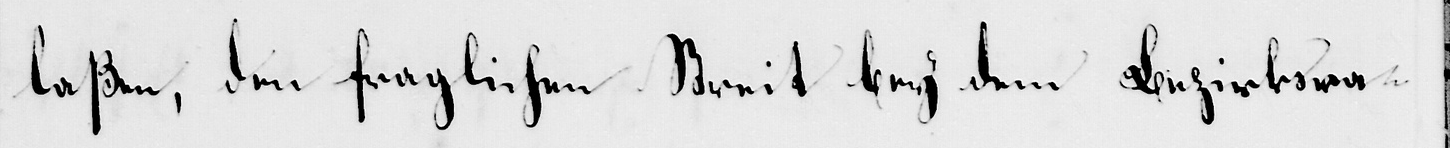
laßen, den fraglichen Streit bey dem Bezirksra¬
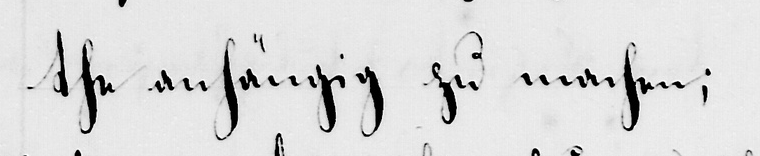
the anhängig zu machen;
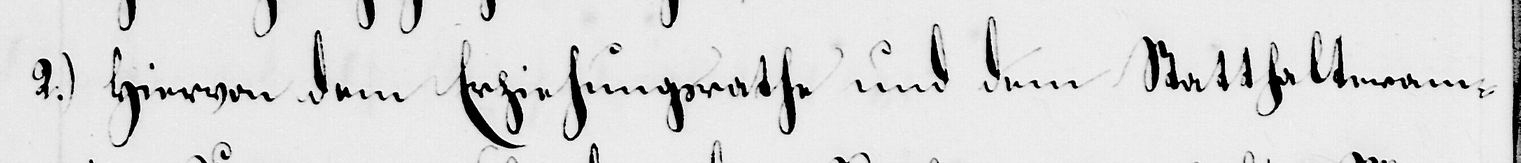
2.) Hiervon dem Erziehungsrathe und dem Statthalteram¬
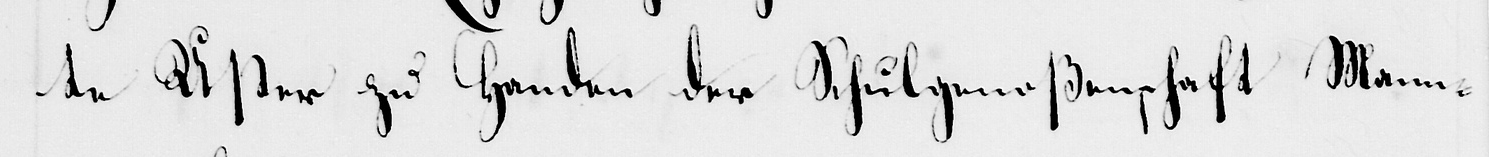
te Uster zu Handen der Schulgenoßenschaft Mann¬
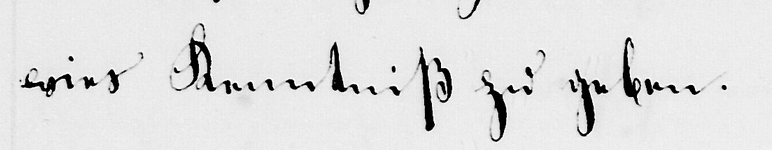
wies Kenntniß zu geben.
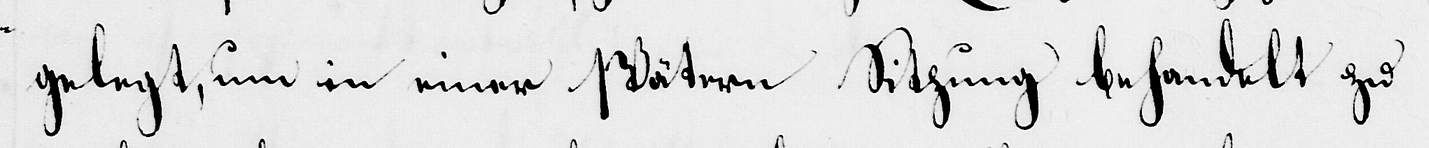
gelegt, um in einer spätern Sitzung behandelt zu
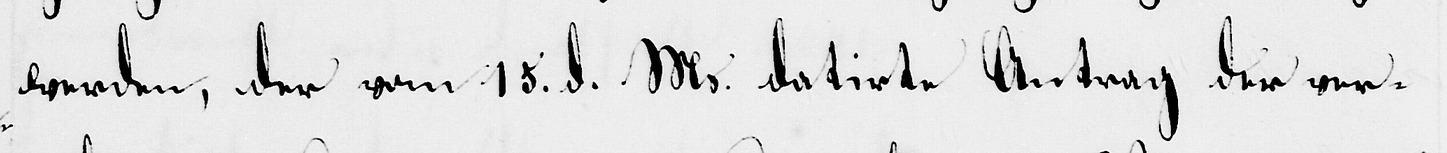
werden, der vom 15. d. Ms. datirte Antrag der ver¬
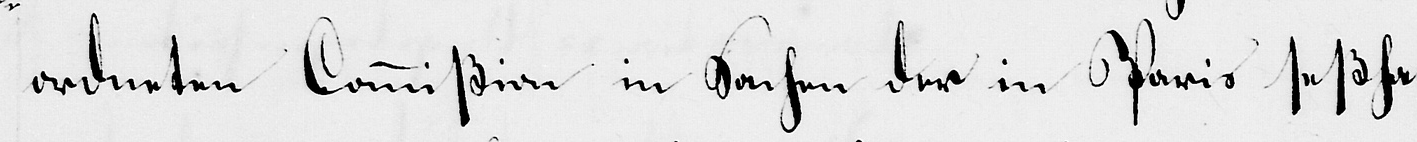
ordneten Commißion in Sachen der in Paris seßhaf¬
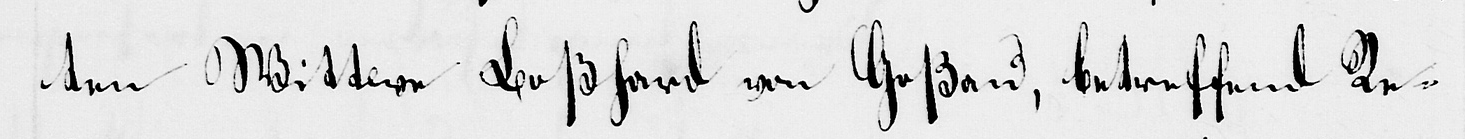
ten Wittwe Boßhard von Goßau, betreffend Re¬
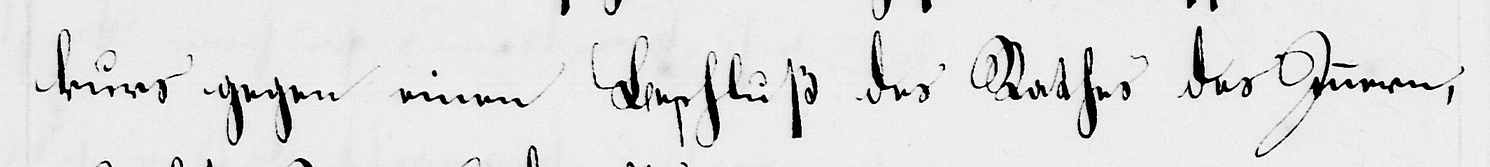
kurs gegen einen Beschluß des Rathes des Innern,
